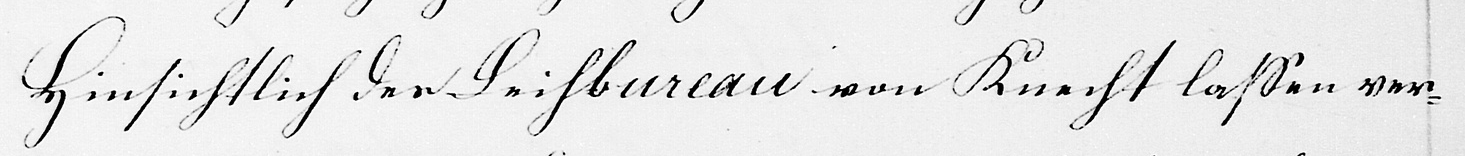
Hinsichtlich des Leihbureau von Knecht laßen ver¬
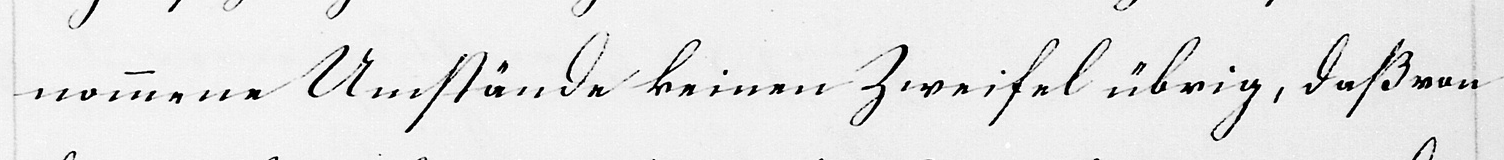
nommene Umstände keinen Zweifel übrig, daß von
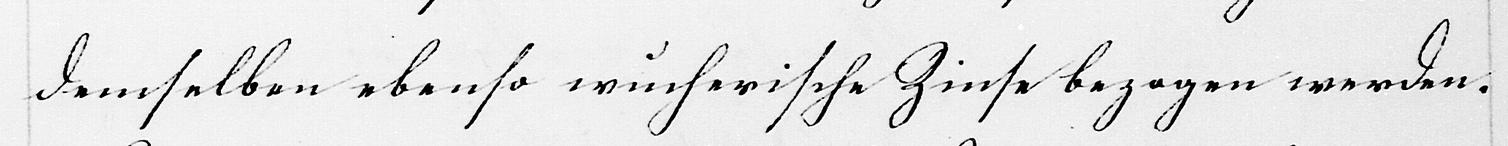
demselben ebenso wucherische Zinse bezogen werden.
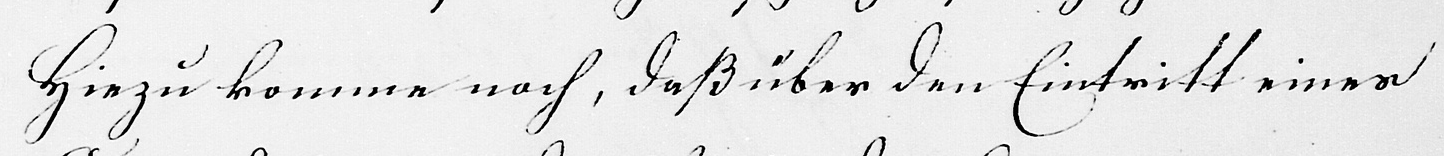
Hiezu komme noch, daß über den Eintritt eines
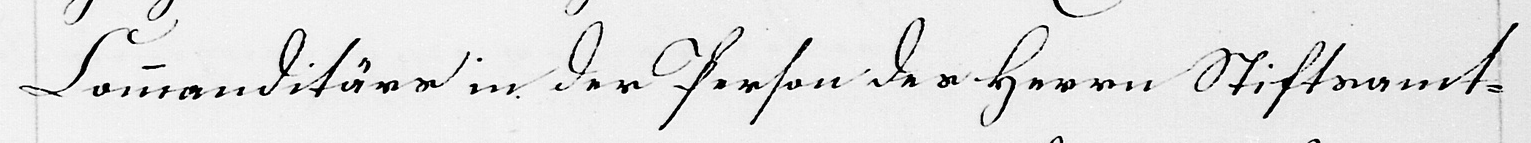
Commanditärs in der Person des Herrn Stiftsamt¬
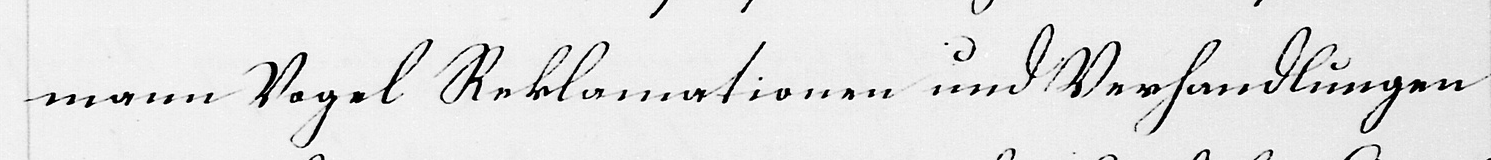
mann Vogel Reklamationen und Verhandlungen
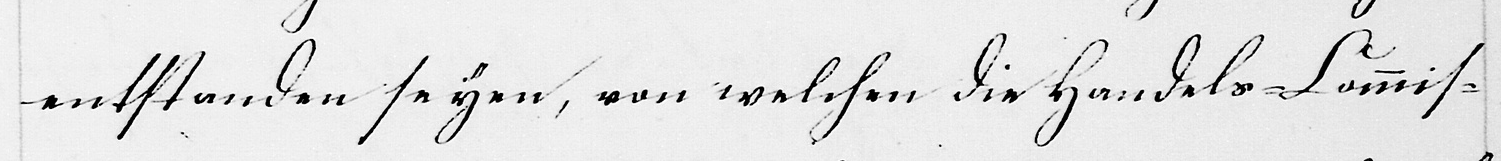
entstanden seyen, von welchen die Handels-Commis¬
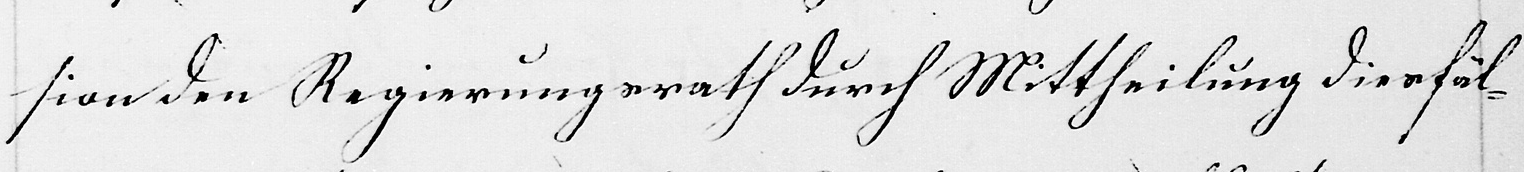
sion den Regierungsrath durch Mittheilung diesfäl¬
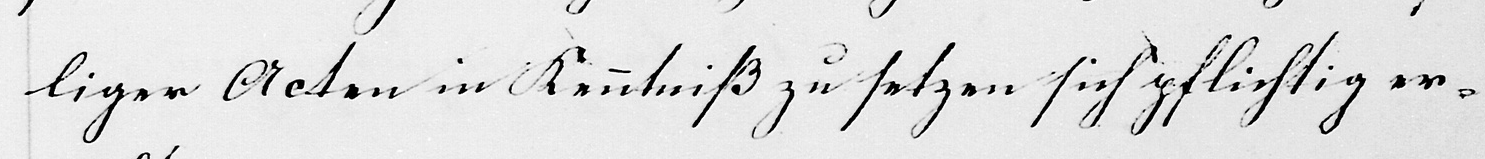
liger Acten in Kenntniß zu setzen sich pflichtig er¬
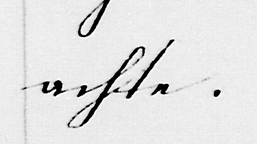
achte.
